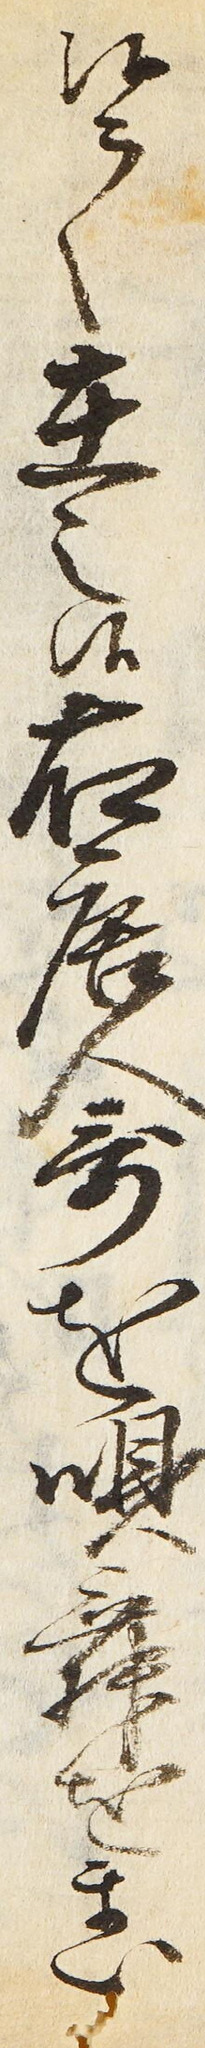候て在之候右唐人哥を唱舞をまい
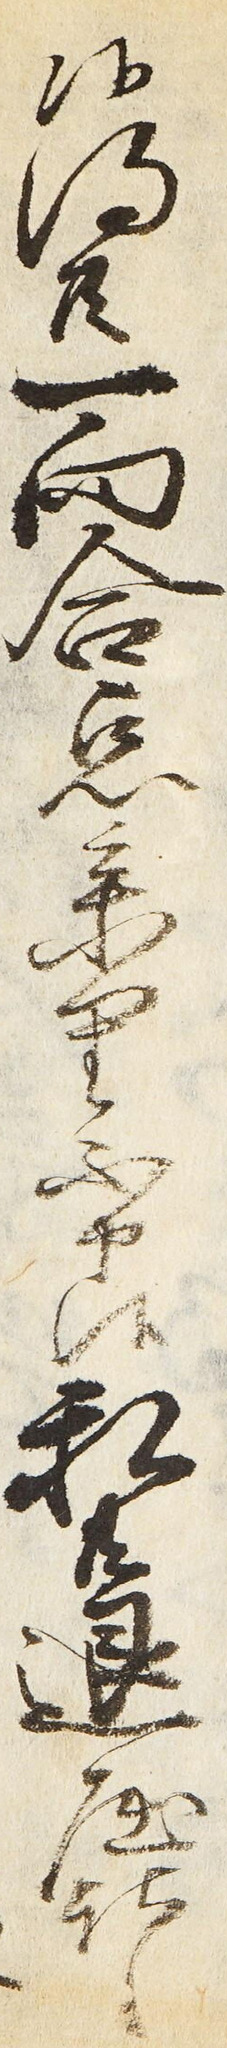候得共一向合点参り不申候私共退屈致し
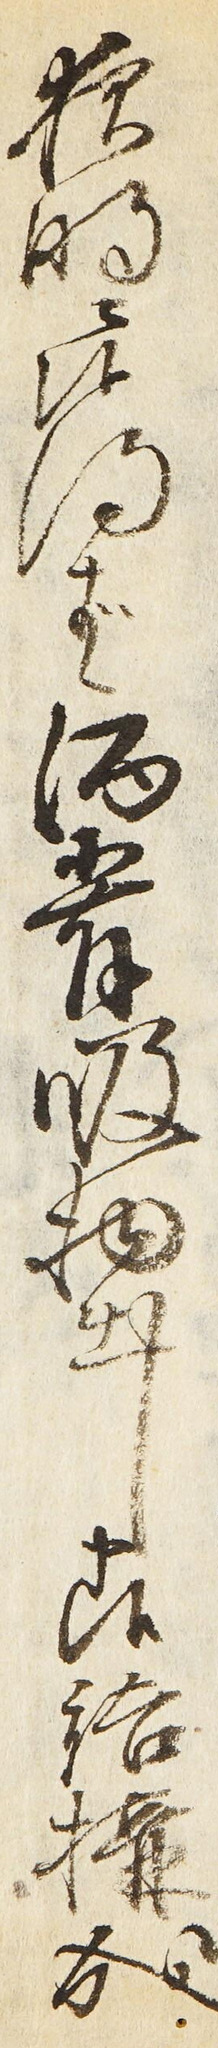夜明ニ候得ば酒肴吸物出し申候結構成
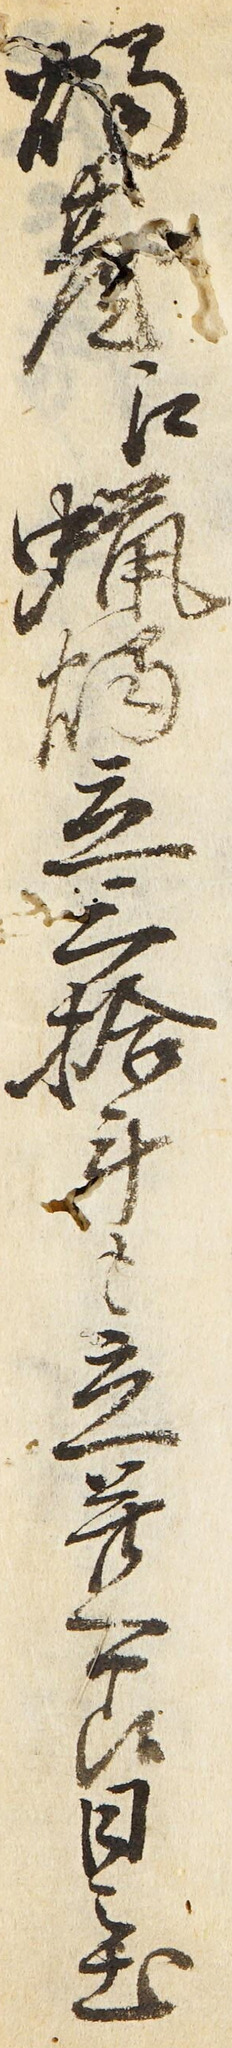燭台江蝋燭立三拾計も立幷へ申候日之出

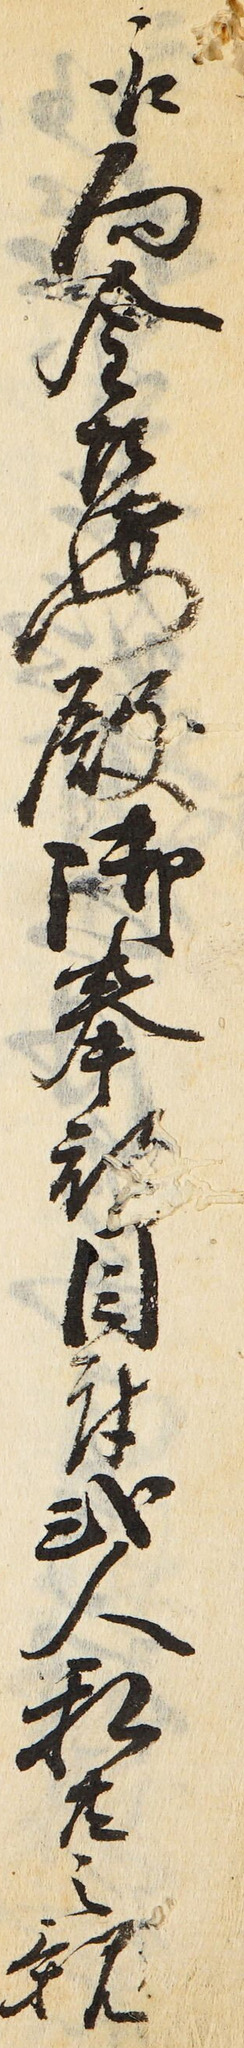江向金左衛門殿御奉行目付弐人私共之親
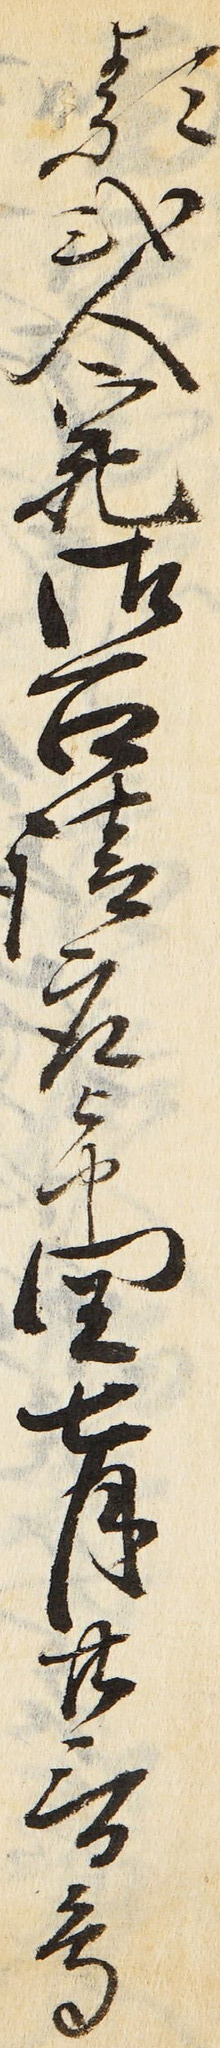類弐人宛御召請取与申閏七月廿三日鳥
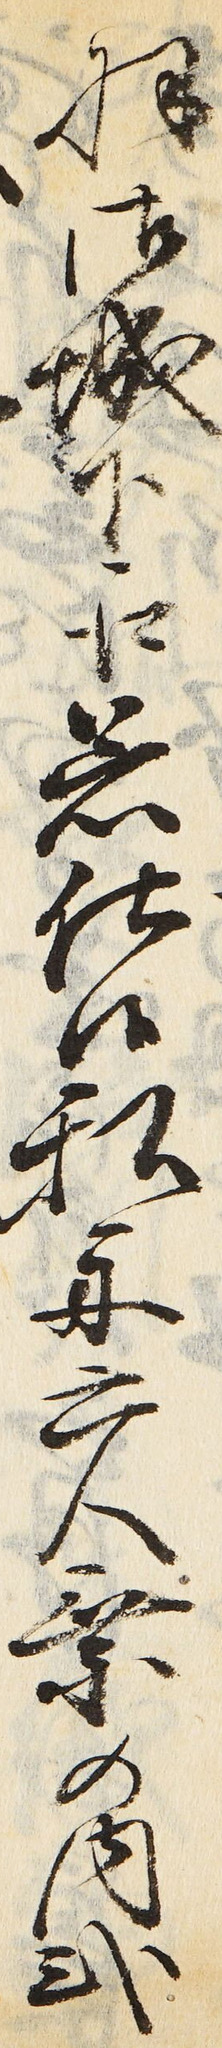羽御城下江着仕候私舟六人乗の内弐
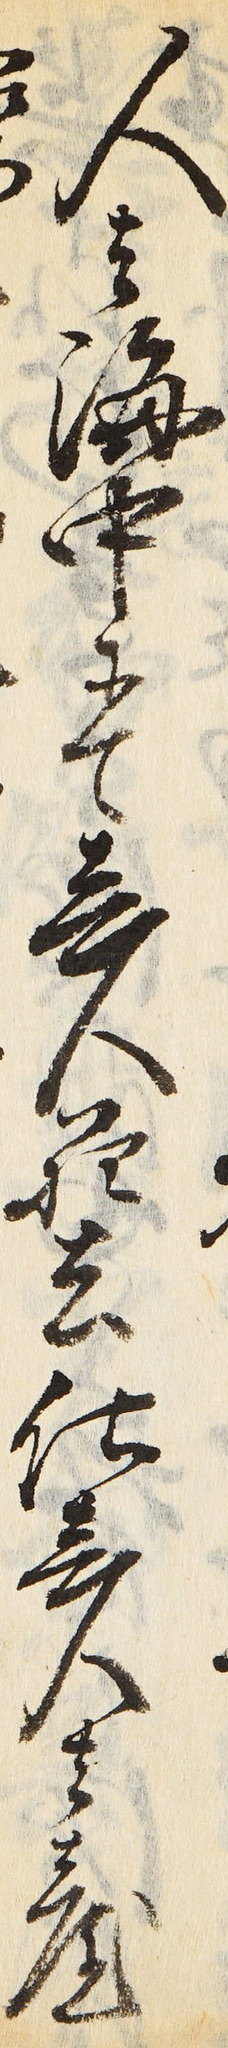人は海中にて壱人死去仕壱人は台
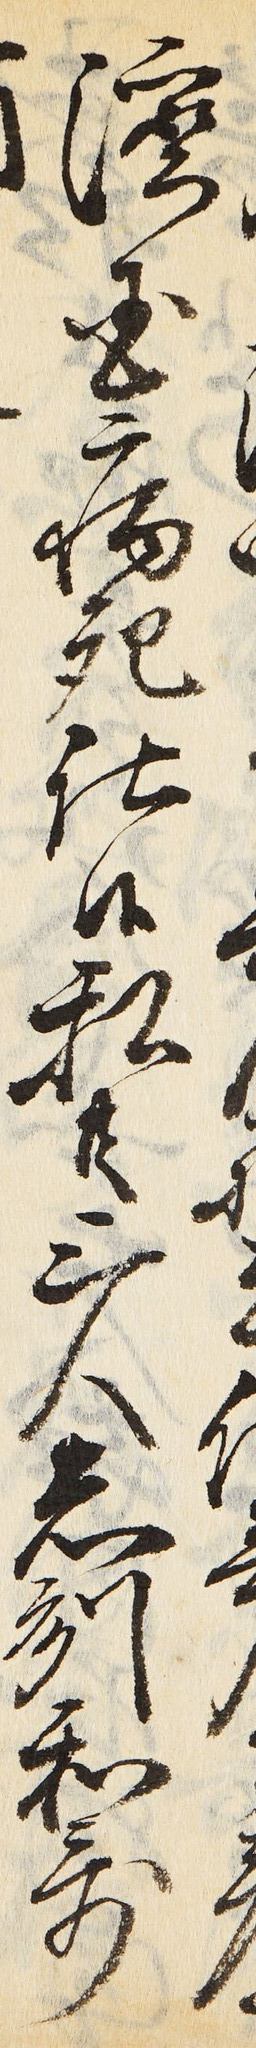湾国病死仕候私共三人志州和哥
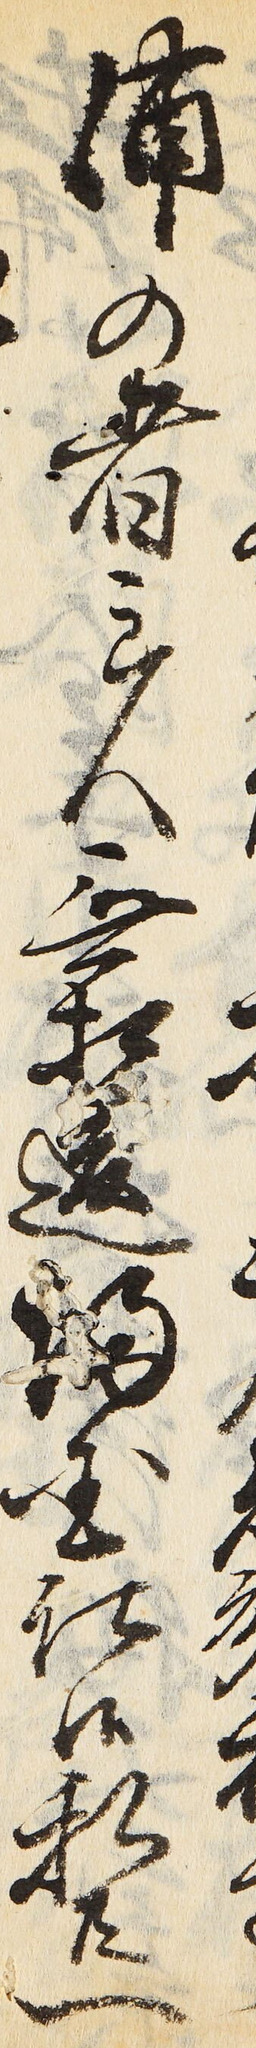浦の者三人無相違帰国仕候私共一
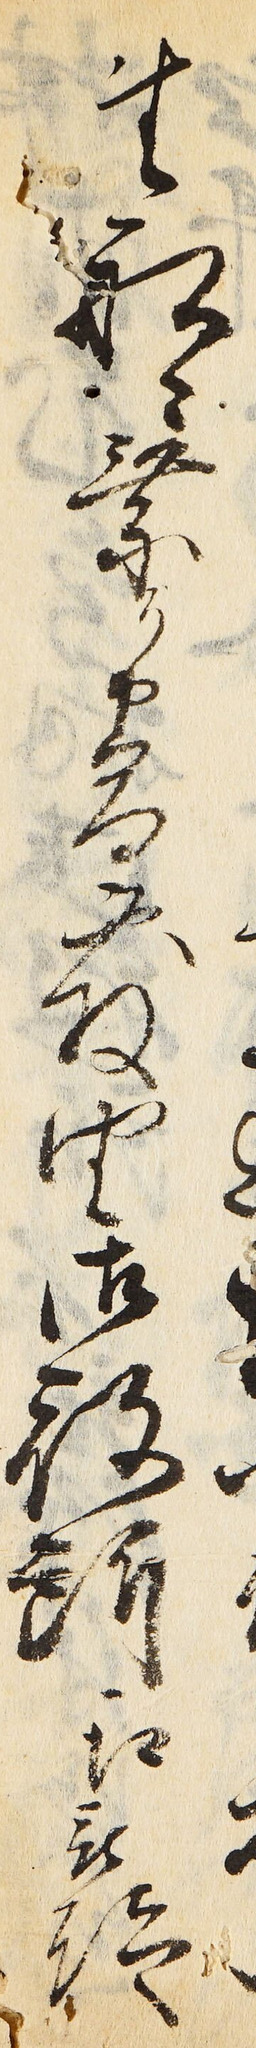生船ニ乗り申間敷由御役所江被仰
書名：志州鳥羽船頭外国江吹流し候一件
